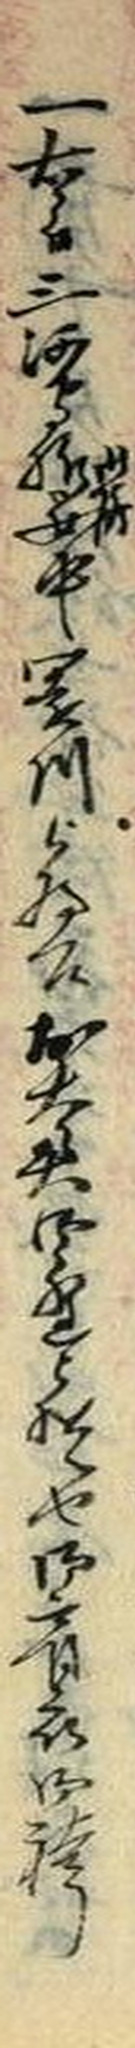一右ニ付三河守様御附女中園川被為召於大奥御逢被遊候由御肩衣御袴

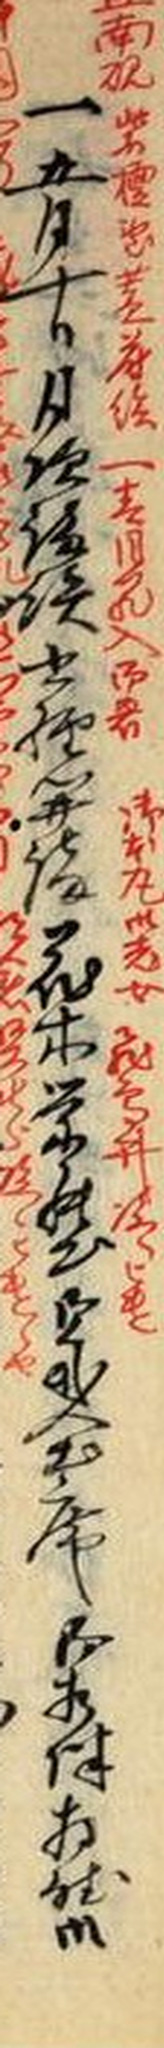一五月十日月次講談書経開講花木栄罷出御用人出席御相伴拝聴御
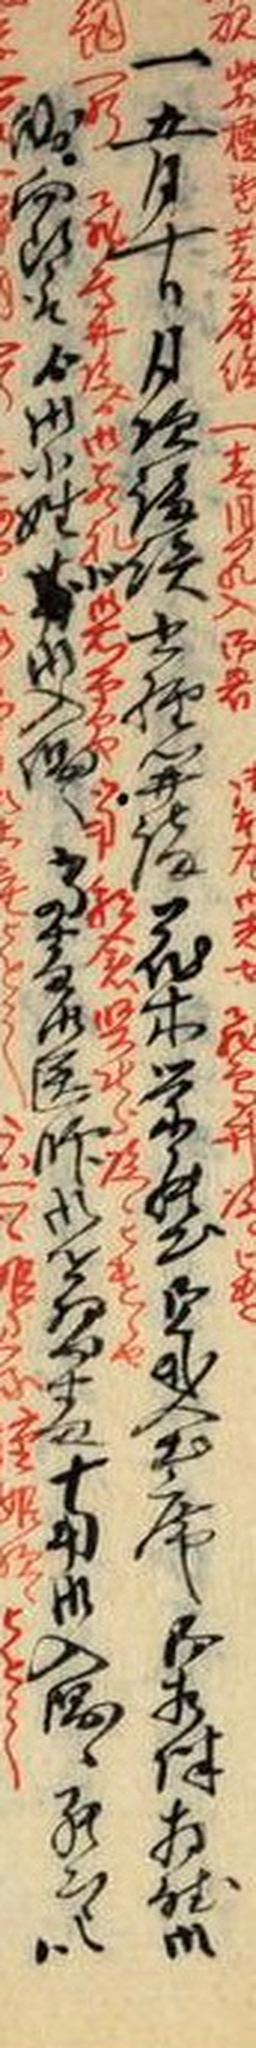側向頭取ゟ御小姓御入側へ当番医師御近習番南御入側へ罷出候以
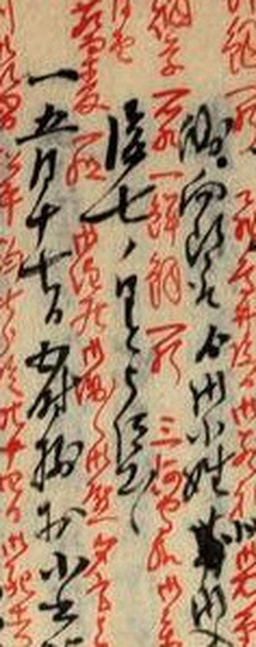後七ノ日と被仰出候
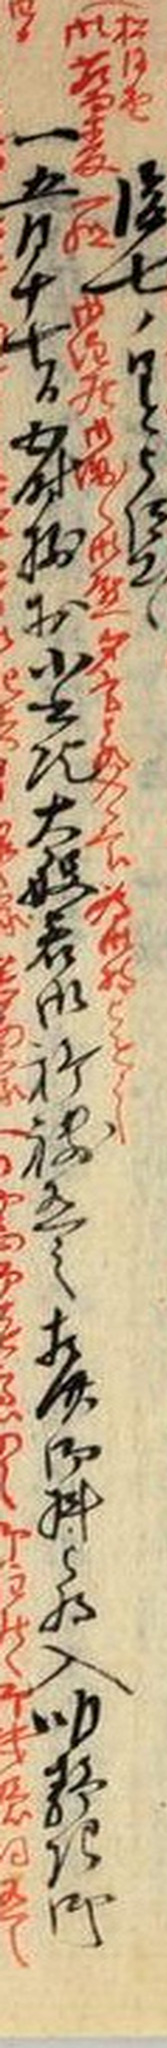一五月十七日五時揃於小書院大般若御祈祷有之相済御拝被為入明静院御
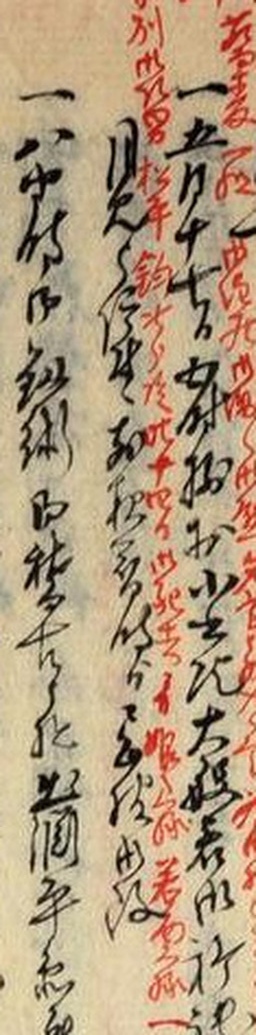目見被仰付候前夜暮時ゟ忌服御改
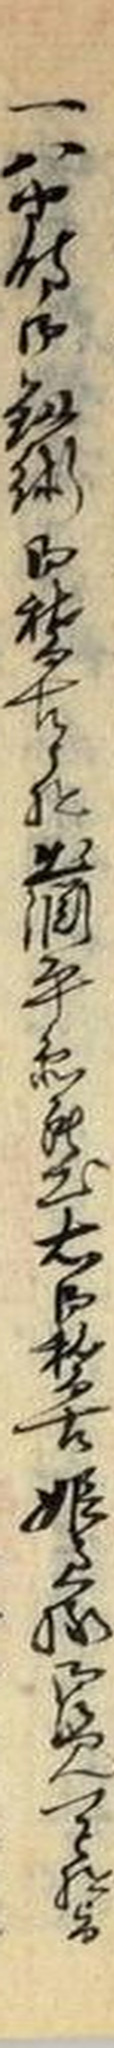一八半時釼術御稽古被遊出淵平兵衛罷出右御稽古姫君様御覧可被遊旨
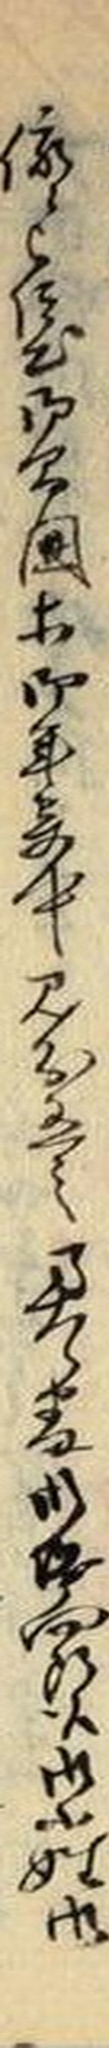俄ニ被仰出御間囲等御年寄中見分有之奥之番御側向頭取御小姓御
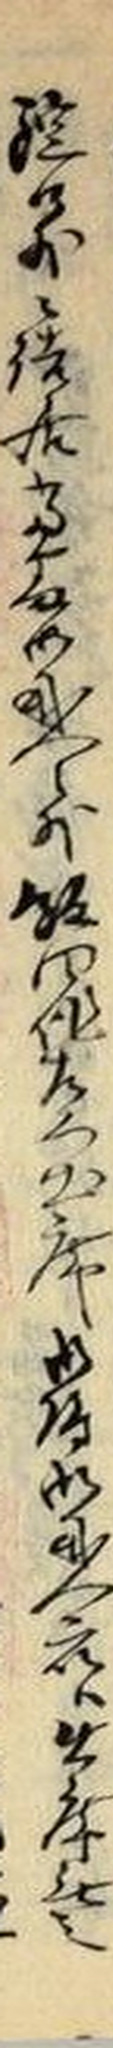錠口外ニ詰居当番御用人之外飯田作左衛門出席御附御用人衆ハ出席無之
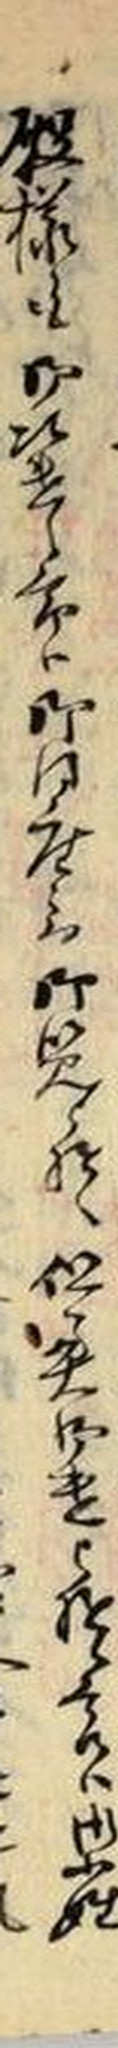殿様ニも御次遣之節ハ御同座ニ而御覧被遊候但奥御遣被遊候節ハ御小姓
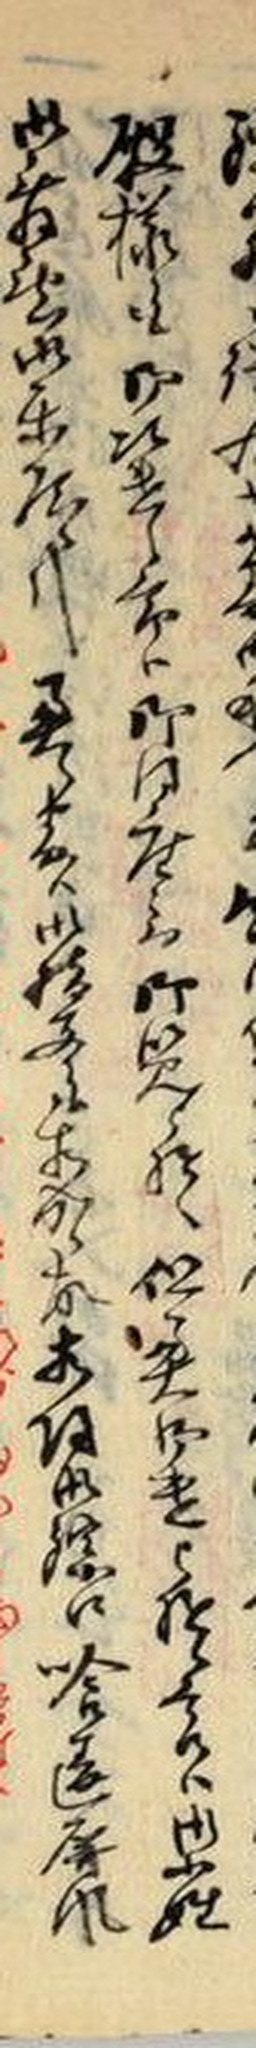御舞台御楽屋へ引奥之番ハ御指相成候故相伺御錠口喰違屏風
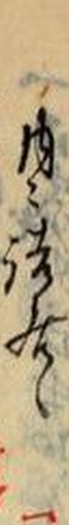内ニ詰居候
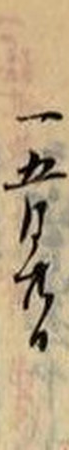一五月廿日
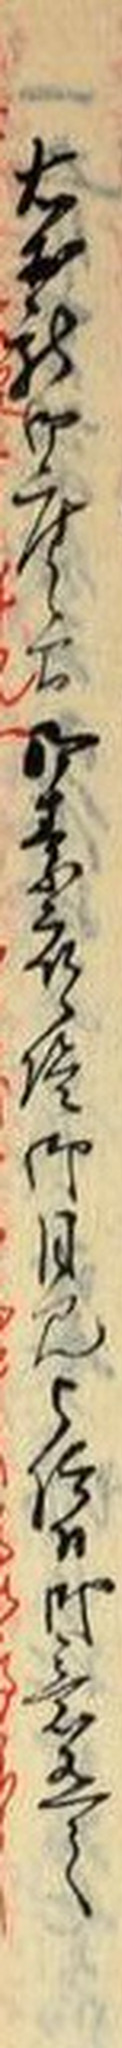右於新御座之間御素衣之侭御目見被仰付御意有之
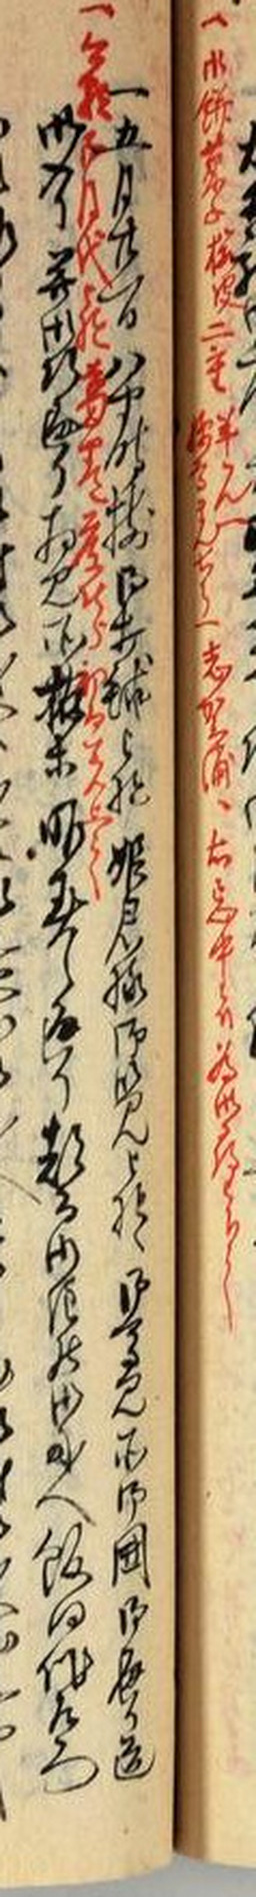一五月廿一日八半時揃御打毬被遊姫君様御覧被遊候御馬見所御囲御通り道
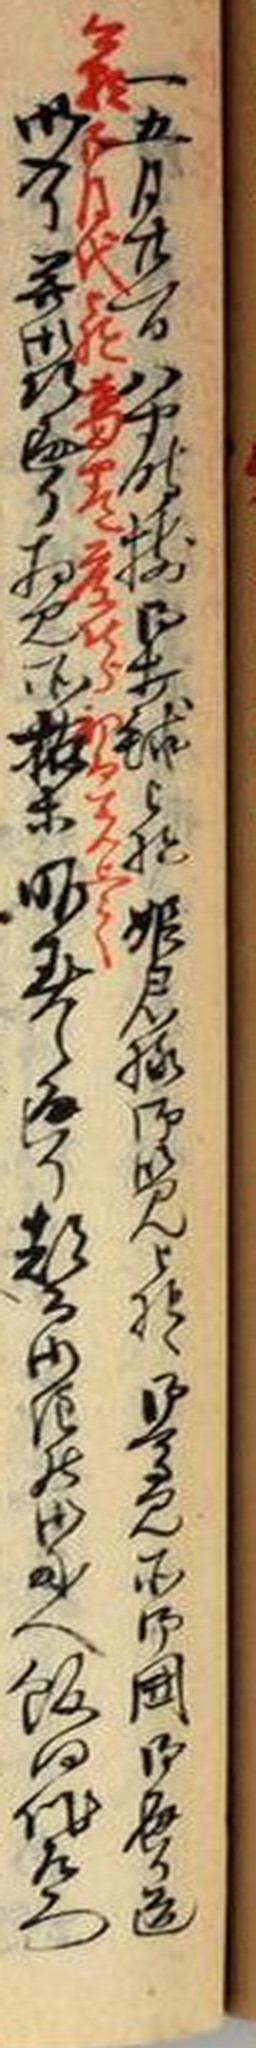御〆り并御次通り拝見所拵等昨春之通り都而御住居御用人飯田作左衛門
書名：少傅日録抄（斉承付側向頭取日記、在府）
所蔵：福井県文書館 Fukui Prefectural Archives
